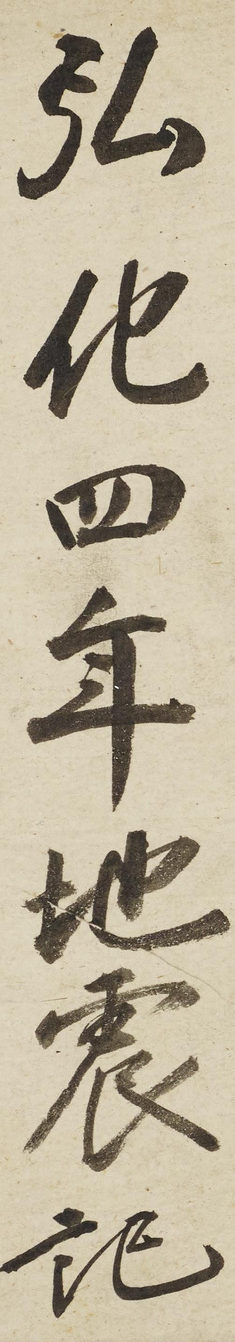弘化四年地震記+

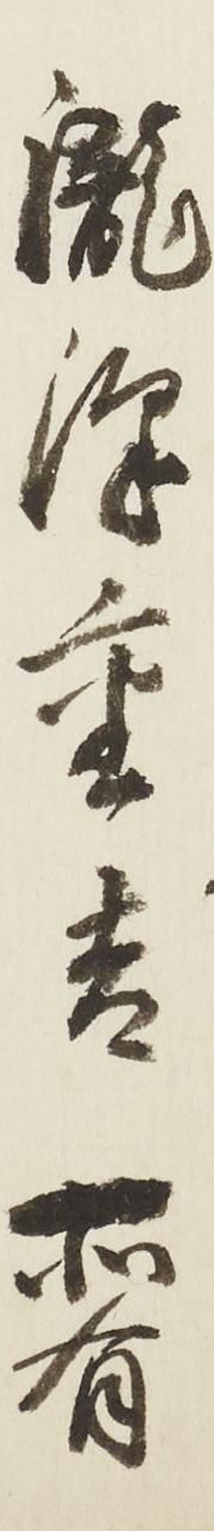滝沢重吉所有
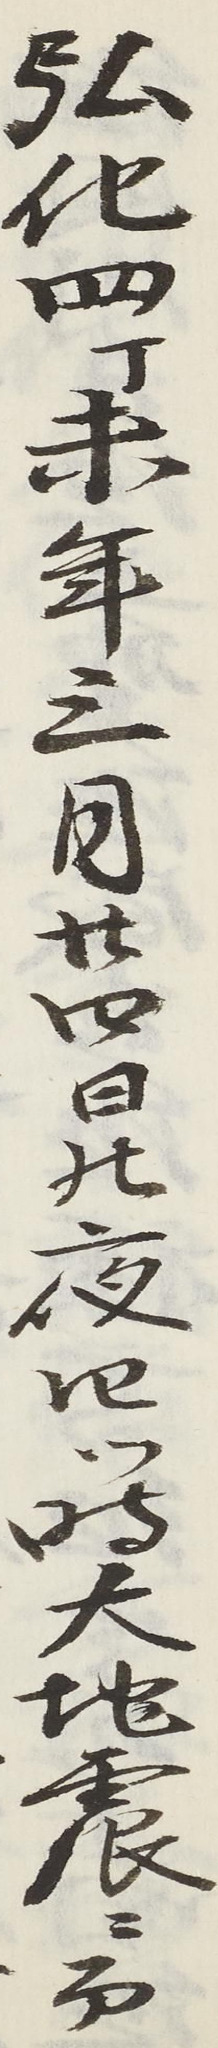弘化四丁未年三月廿四日の夜四ッ時大地震二而
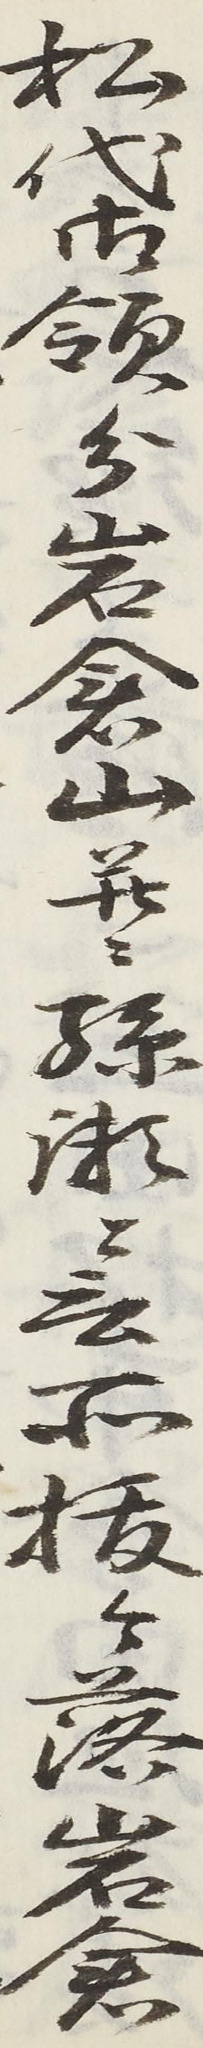松代御領分岩倉山并二孫瀬と云所抜ヶ落岩倉
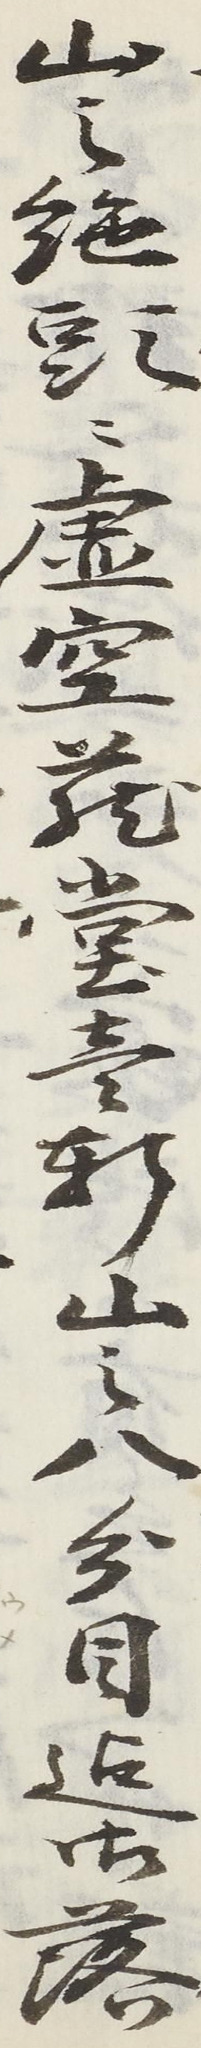山之絶頭二虚空蔵堂壱軒山之八分目迄御落
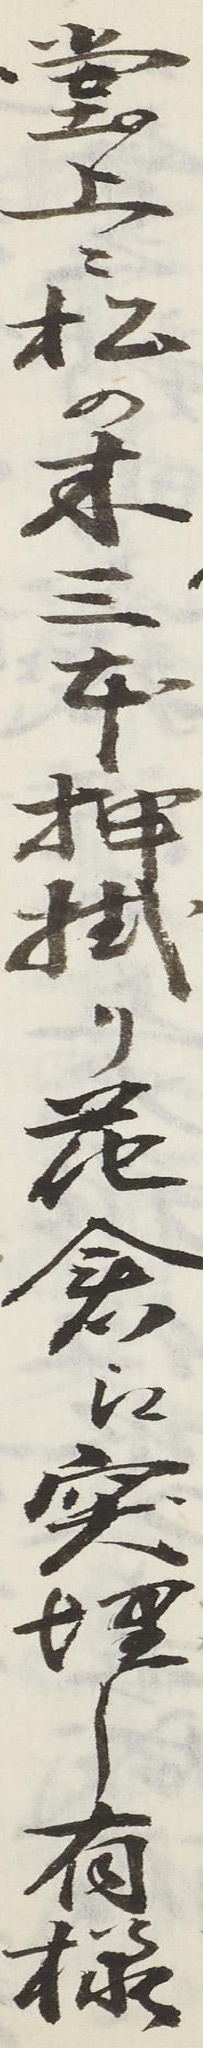堂上二松の木三本押掛り花倉江突埋し有様
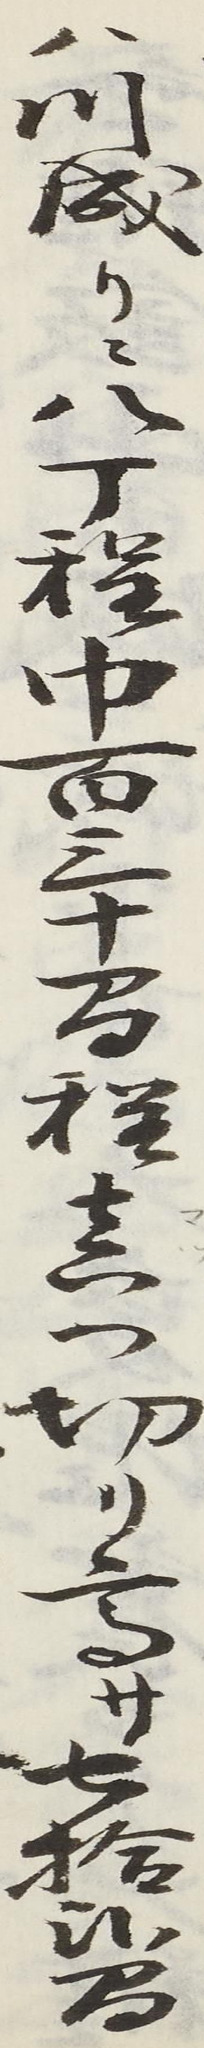ハ川成り二八丁程巾百三十間程真つ切り高サ七拾弐間
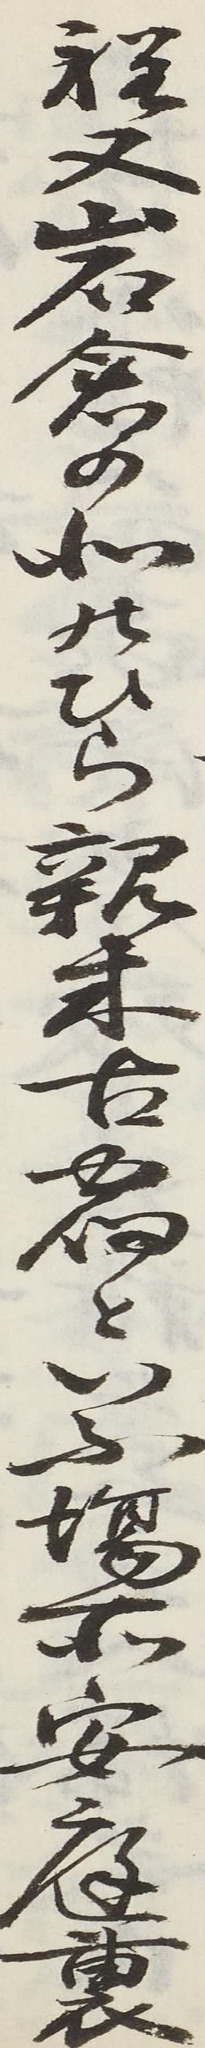程又岩倉の北のひら親木古宿といふ場所安庭裏
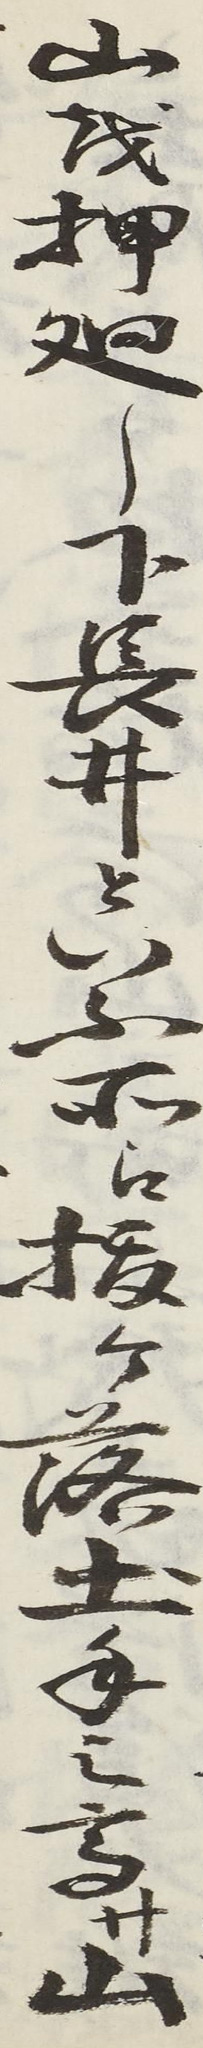山を押廻し下長井といふ所江抜ケ落土手之高サ山
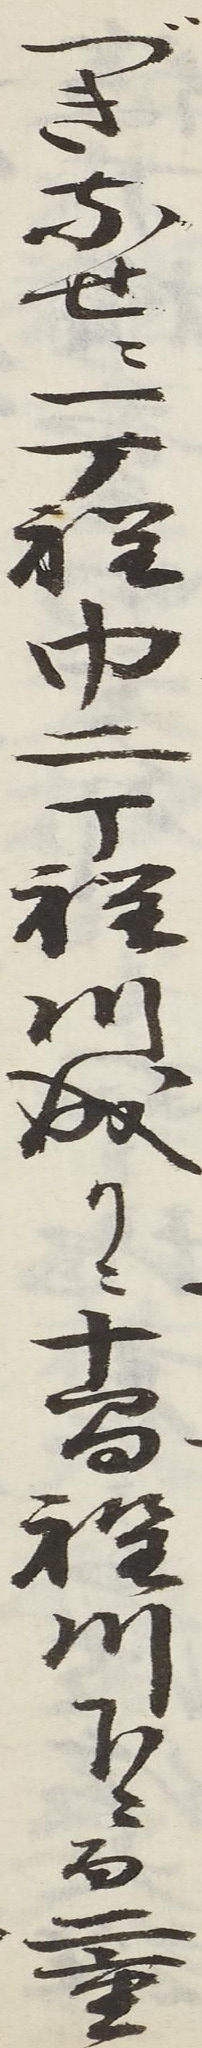づきなせ二一丁程巾二丁程川成り二十間程川下二而二重
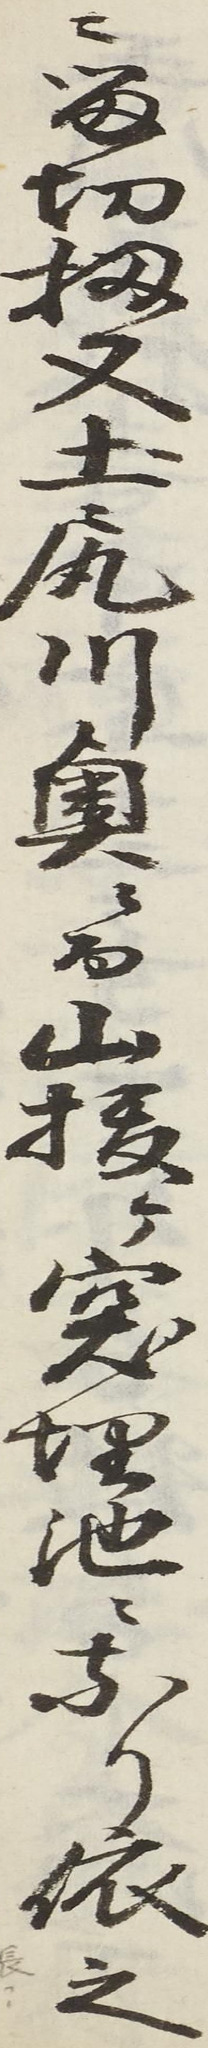二留切扨又土尻川奥二而山抜ヶ突埋池二なり依之
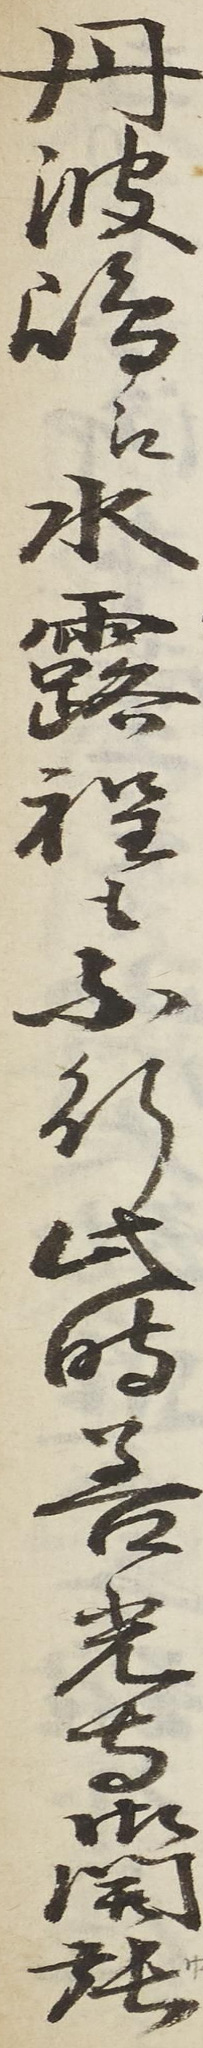丹波嶋江水露程も不行此時善光寺御開張

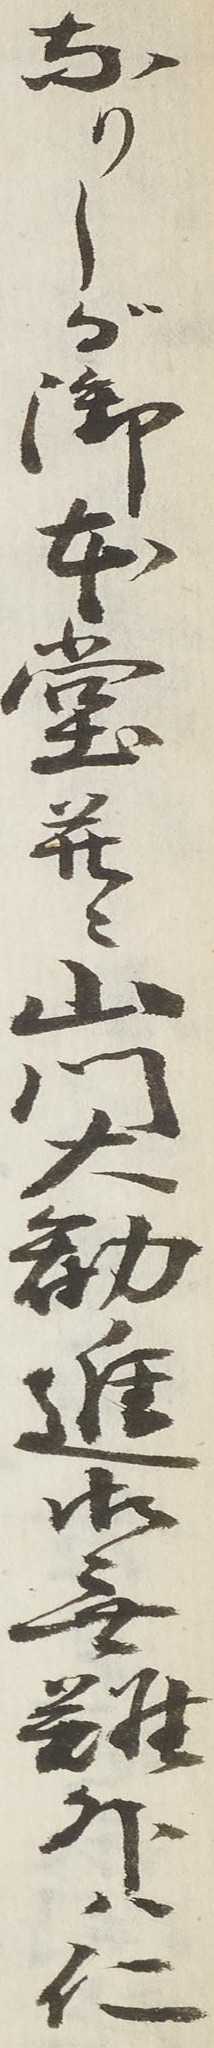なりしが御本堂并二山門大勧進御無難外ハ仁
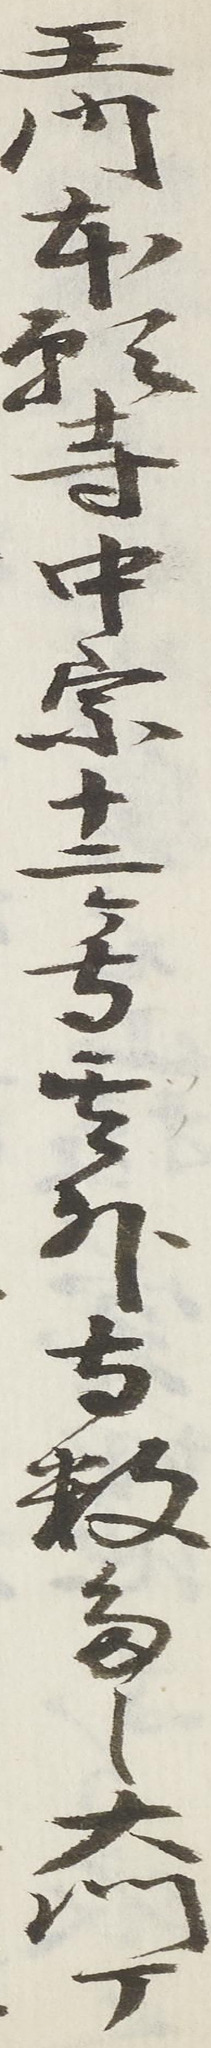王門本願寺中宗十二ヶ寺其外寺数多し大門丁
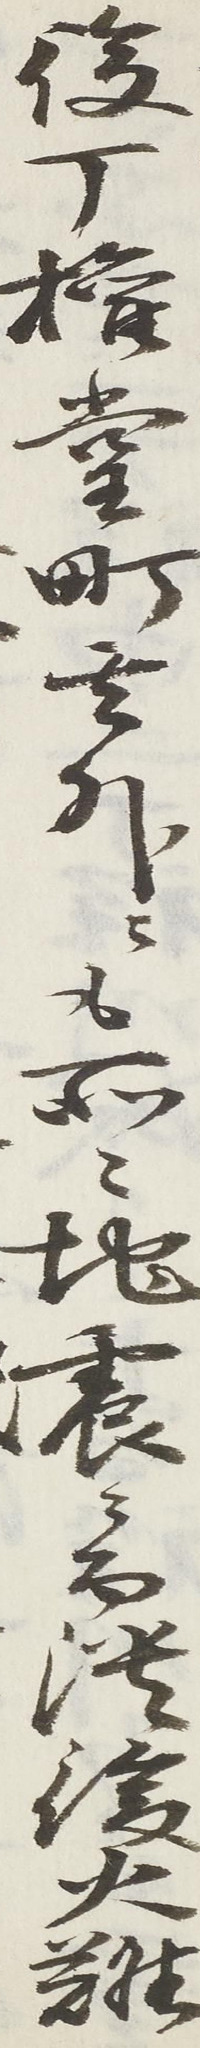後丁権堂町其外二も所々地震二而潰後火難
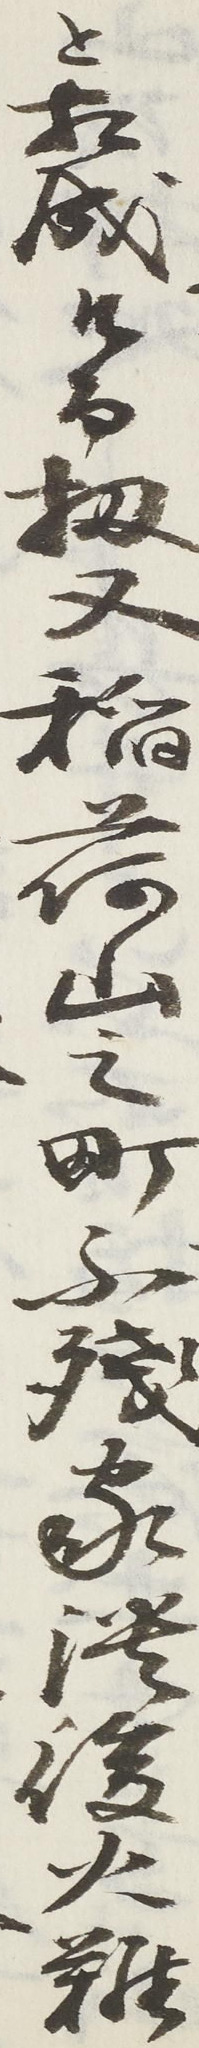と相成候而扨又稲荷山之町不残家潰後火難
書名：弘化四年地震記
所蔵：東京大学地震研究所図書室 Earthquake Research Institute Library, The University of Tokyo, JAPAN
